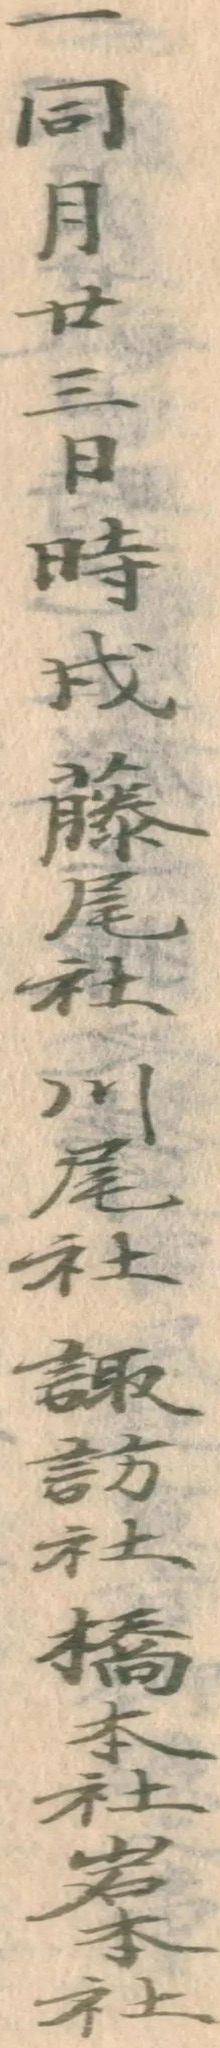一同月廿三日時戌藤尾社川尾社諏訪社橋本社岩本社
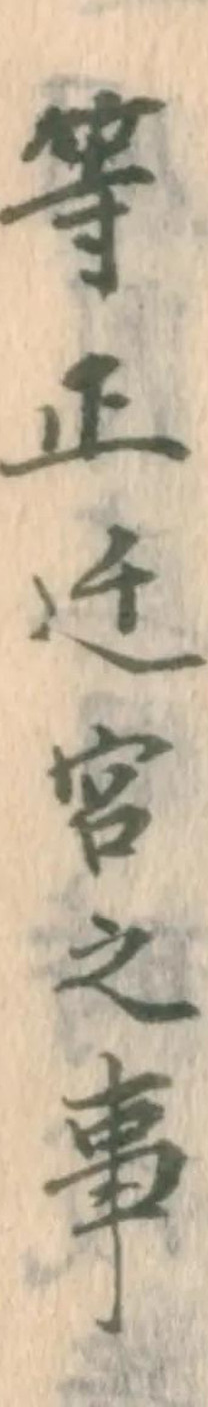等正迁宮之事
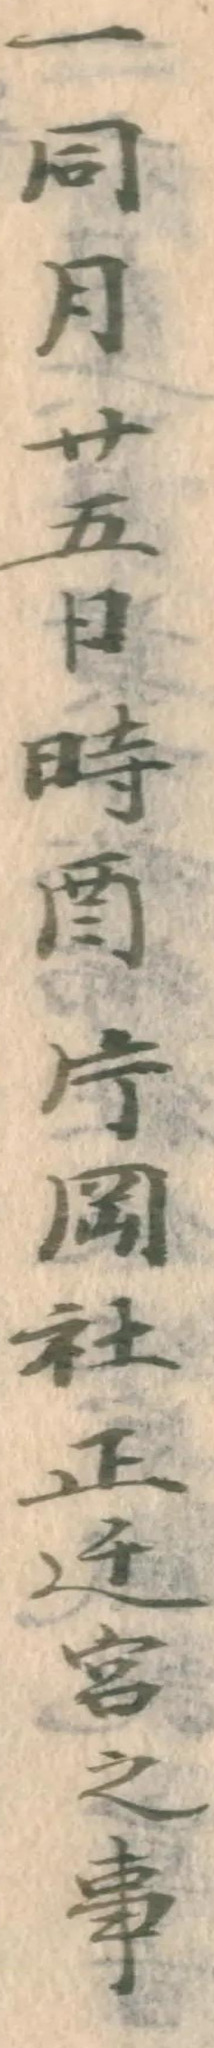一同月廿五日時酉片岡社正迁宮之事
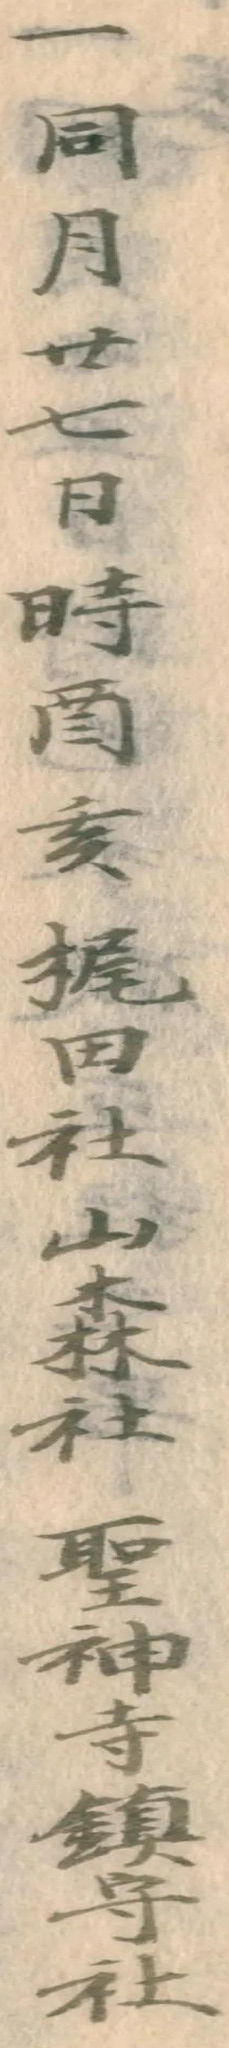一同月廿七日時酉亥梶田社山森社聖神寺鎮守社
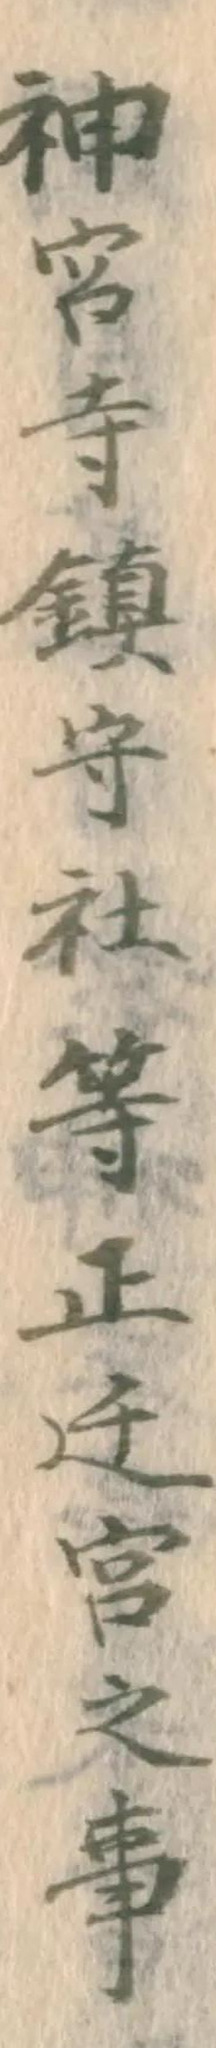神宮寺鎮守社等正迁宮之事
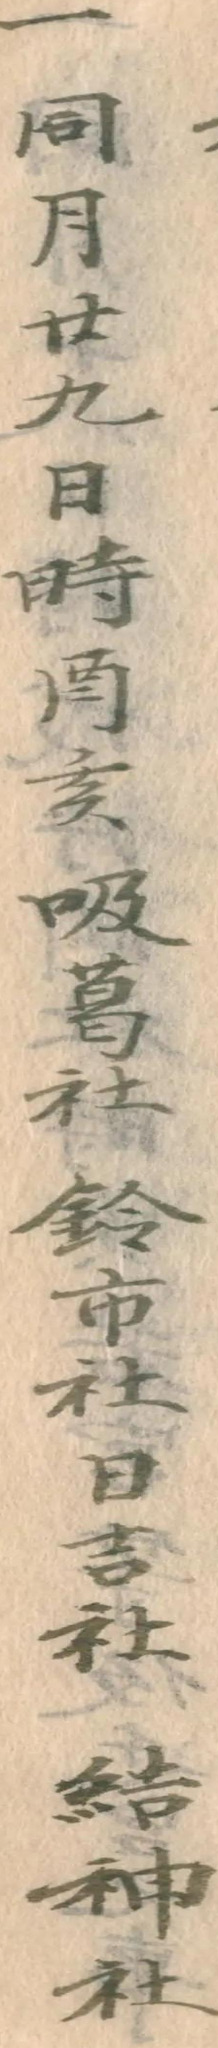一同月廿九日時酉亥吸葛社鈴市社日吉社結神社
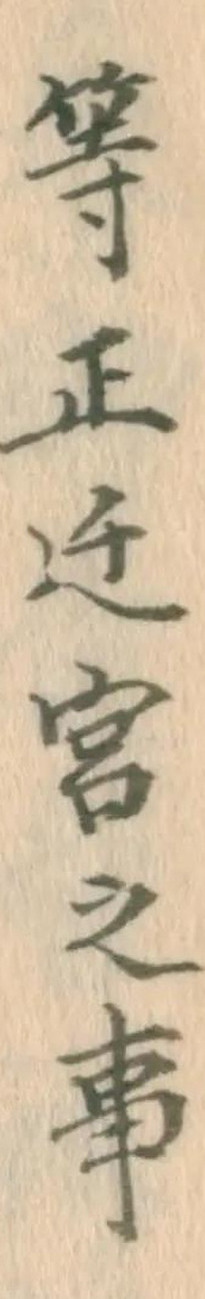等正迁宮之事
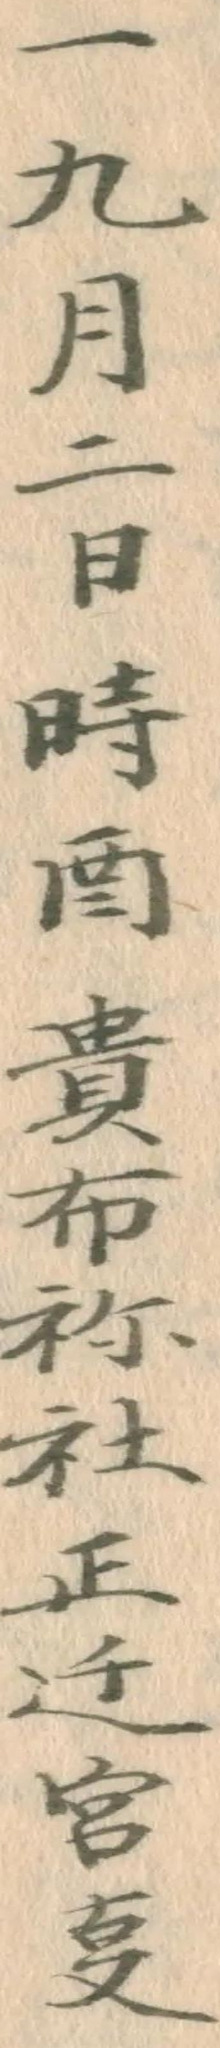一九月二日時酉貴布祢社正迁宮事
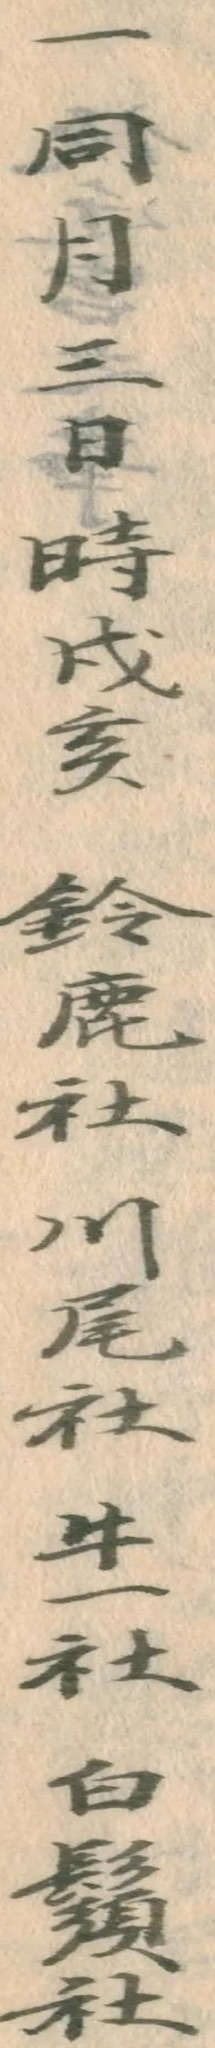一同月三日時戌亥鈴鹿社川尾社牛一社白鬚社
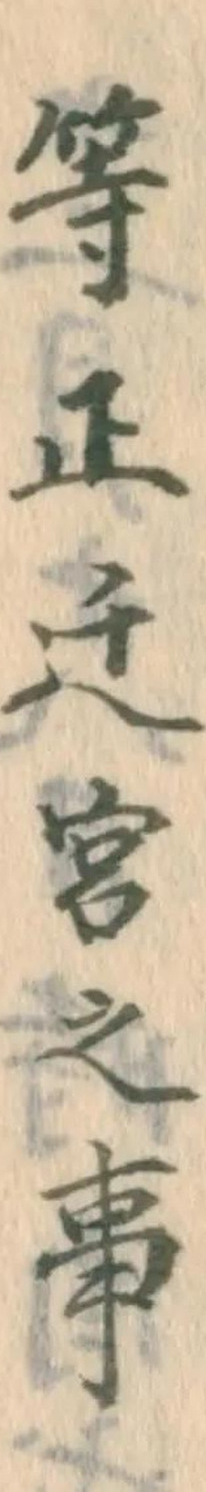等正迁宮之事
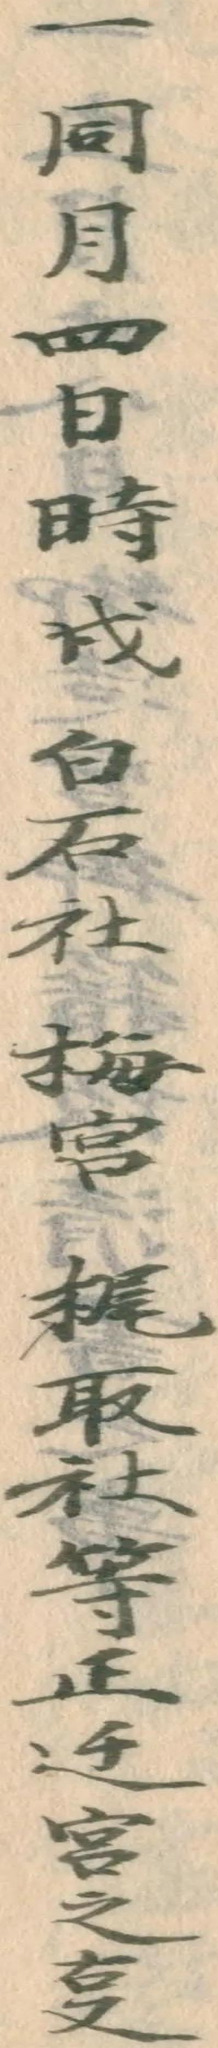一同月四日時戌白石社梅宮梶取社等正迁宮之事
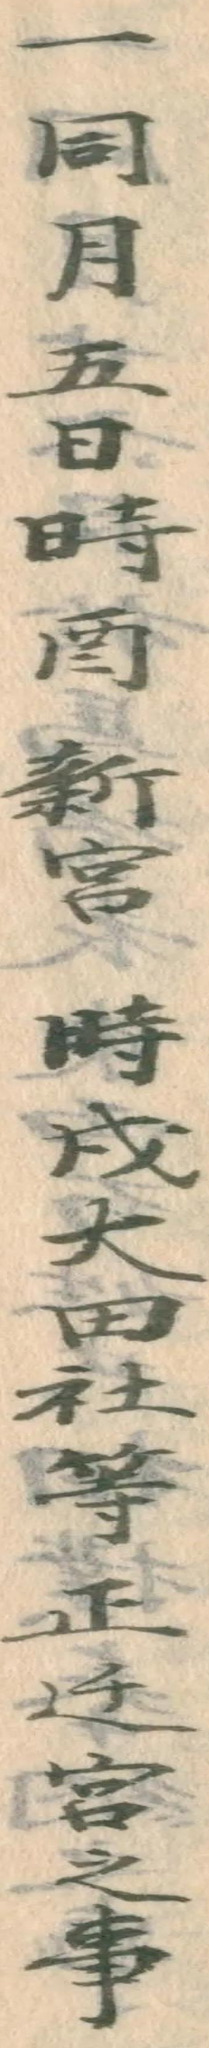一同月五日時酉新宮時戌大田社等正迁宮之事
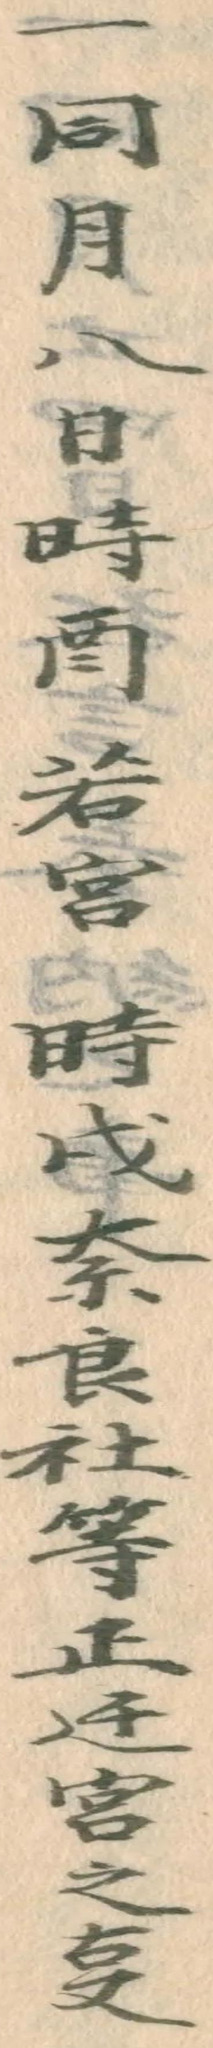一同月八日時酉若宮時戌奈良社等正迁宮之事
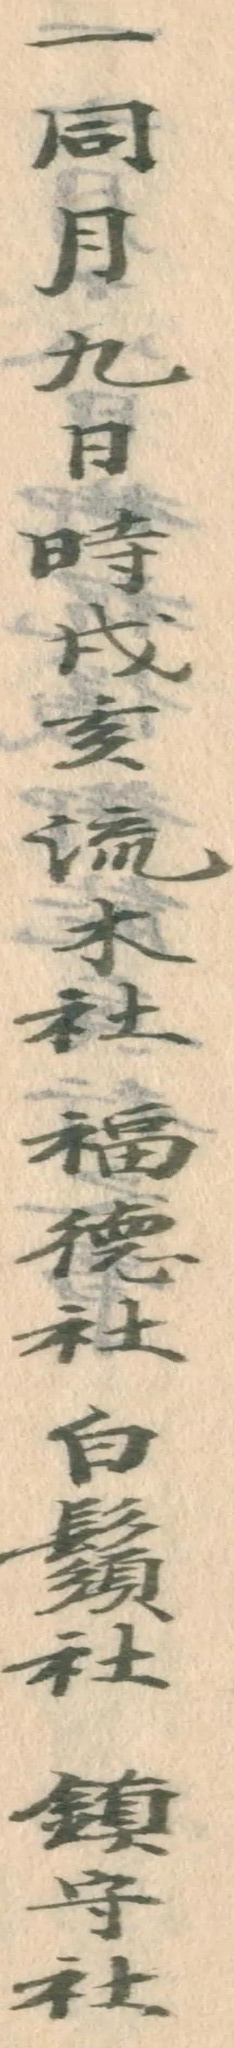一同月九日時戌亥流木社福徳社白鬚社鎮守社
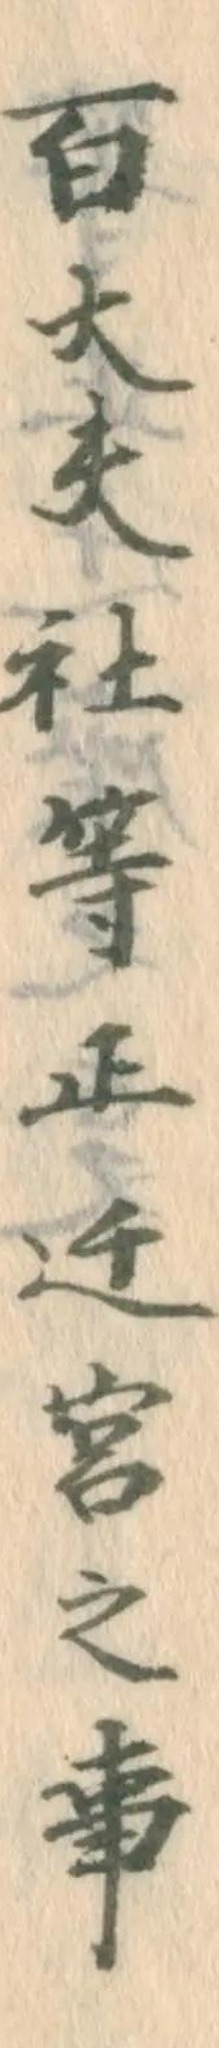百大夫社等正迁宮之事
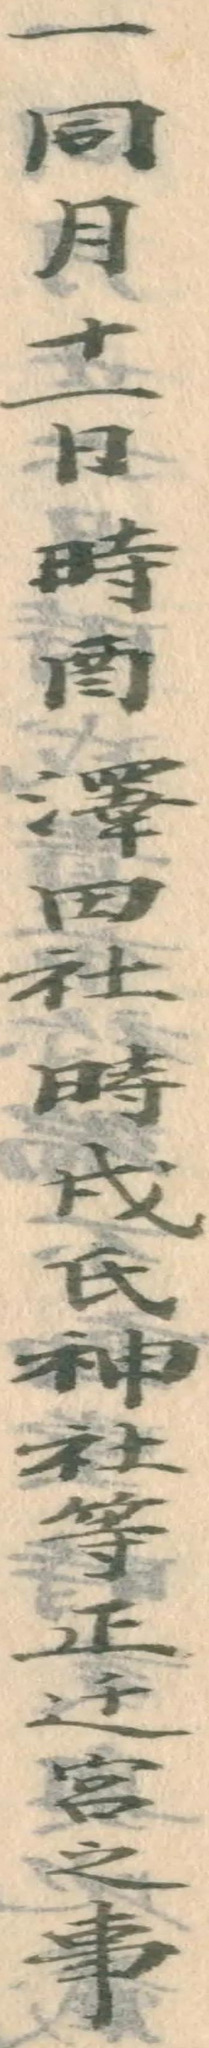一同月十一日時酉澤田社時戌氏神社等正迁宮之事
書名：賀茂社記録. 第17冊
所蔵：国立国会図書館 National Diet Library, JAPAN
